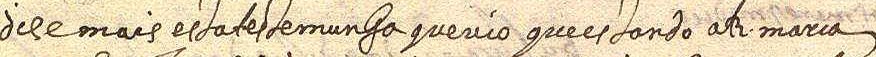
dice mais esta testemunha que uio que estando a R. maria
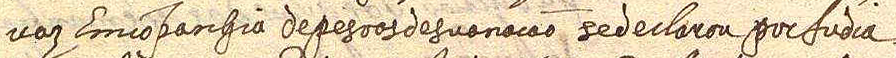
uaz Em cōpanhia de pesoas de sua nacaõ se declarou por Iudia
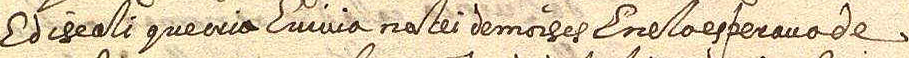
E dise ali que cria E uiuia na lei de moises E nela esperaua de
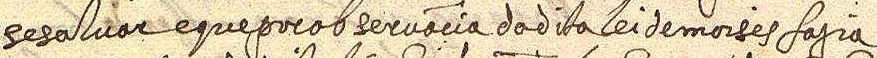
se saluar e que por obseruācia da dita lei de moises fazia
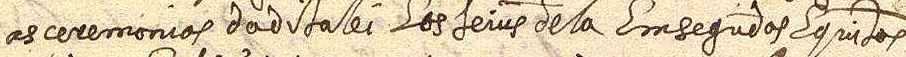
as ceremonias da dita lei E os Ieiūs dela Em segūdas E q̄uitas
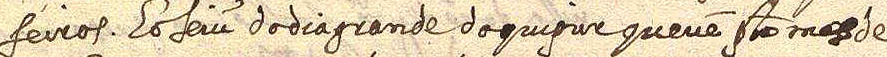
feiras. E o Ieiū do dia grande do quipur que uē pl̄o mes de
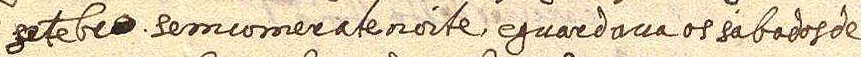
setēbro. sem comer ate noite e guardaua os sabados de
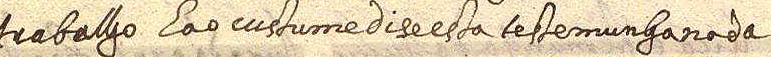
trabalho E ao custume dise esta testemunha nada
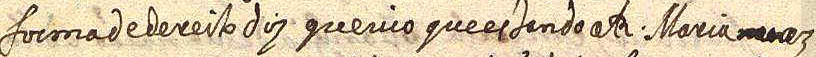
forma de dereito diz que uio que estando a R. Maria uaz
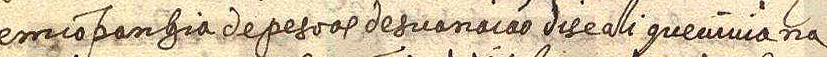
em cōpanhia de pesoas de sua nacaõ dise ali que uiuia na
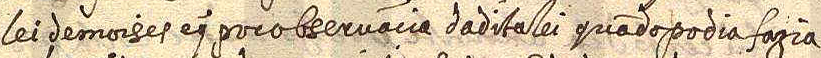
lei de moises e q̄ por obseruāçia da dita lei quādo podia fazia
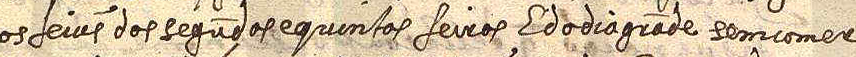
os Ieius̄ das segūdas e quintas feiras E do dia grāde sem comer
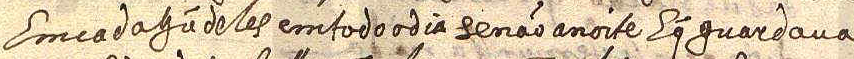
Em cada hū deles em todo o dia senaõ a noite E q̄ guardaua
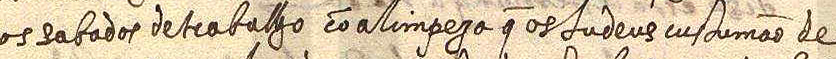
os sabados de trabalho cō a limpeza q̄ os Iudeus custumão de
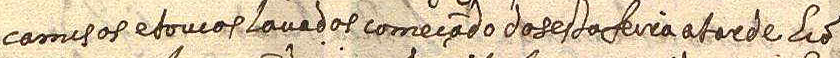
camisas e toucas lauadas começādo da sesta feira a tarde E cō
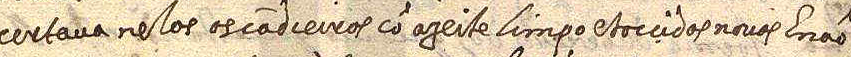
certaua nelas os cādieiros cō azeite limpo e torçidas nouas E naõ
